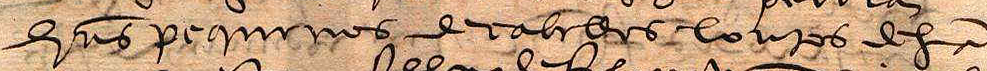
hūs pequenos de cabellos louros de huā
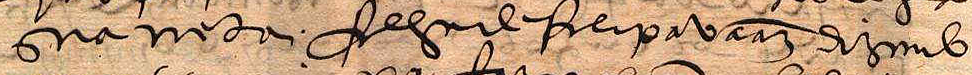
sua neta. filha de felipa vāaz dizendo
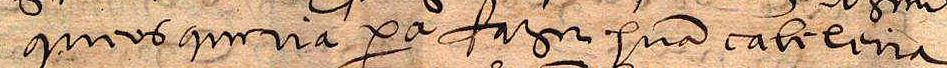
que os queria ꝑa fazer huā cabeleira
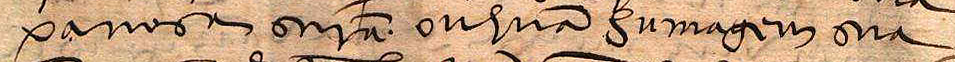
ꝑa nosa snrā ou huā humagem sua
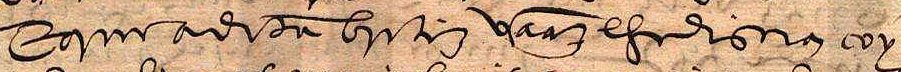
E que a dita britiz vāaz lhe disera coy
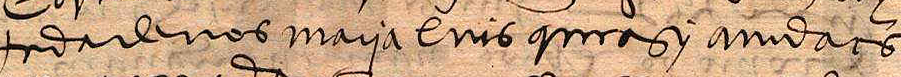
tada de uos marja luis que asy amdaes
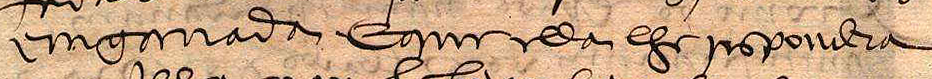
emganada E que ella lhe respondera
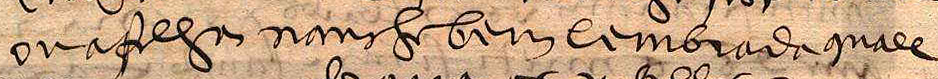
ou a filha nam he bem lembrada quall
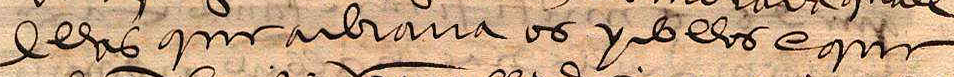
dellas que adoraua os ydollos e que
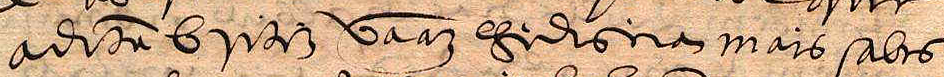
a dita britiz vāaz lhe disera mais sabes
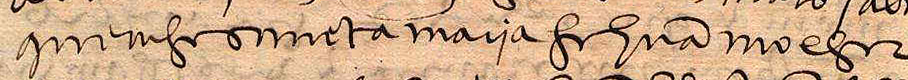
quem he sancta marja he huā molher
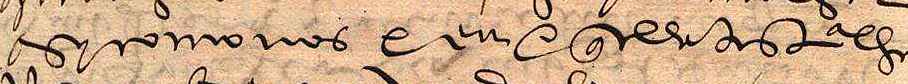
asy como uos e eu e q̄ ella testa lhe
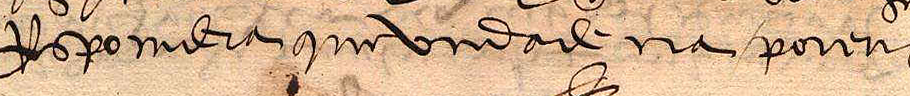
Respomdera que verdade era porem
